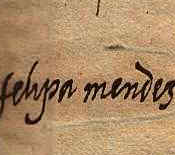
felipa mendez
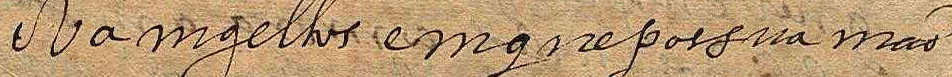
evamgelhos em que pos sua maõ
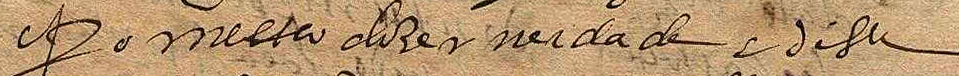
e ꝑometteo dizer uerdade E disse
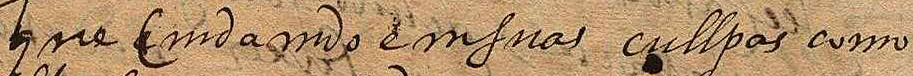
que Cuidamdo em suas cullpas como
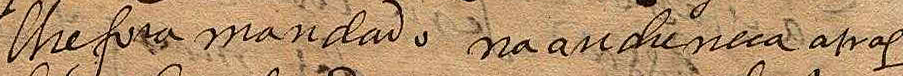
lhe fora mandado na audiencea atras
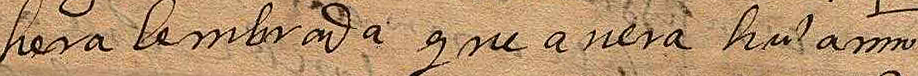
hera lembrada que auera hū an̄no
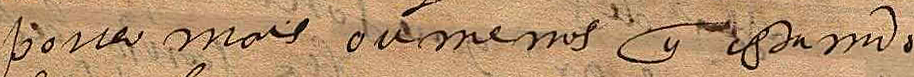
pouco mais ou menos q̄ estamdo
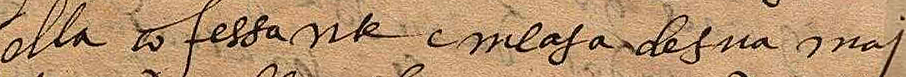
ella cōfessante em casa de sua maj
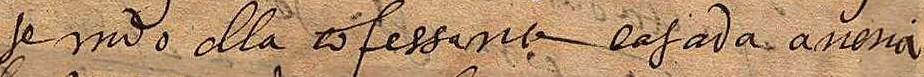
semdo ella cōfessante casada aueria
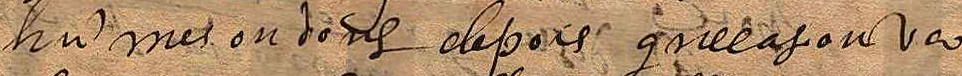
hū mes ou dous depois que casou veo
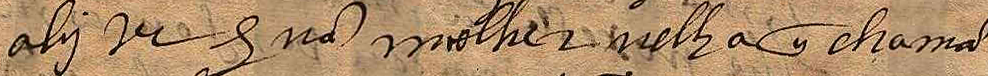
aly ter huā molher uelha a q̄ chamā
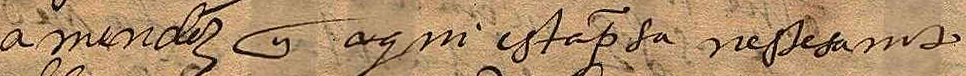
a mendez q̄ aqui esta p̄sa neste samto
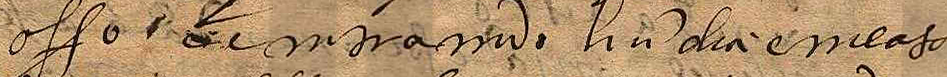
offo e emtramdo hū dia em casa
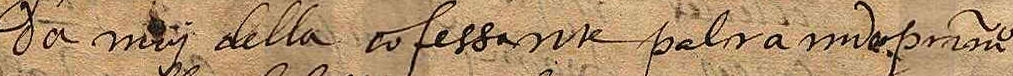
da maj della cōfessante palramdo primro
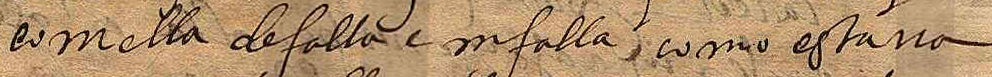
com ella de falla em falla como estaua
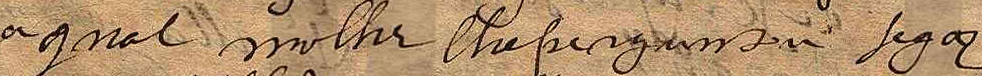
a qual molher lhe perguntou se gar
